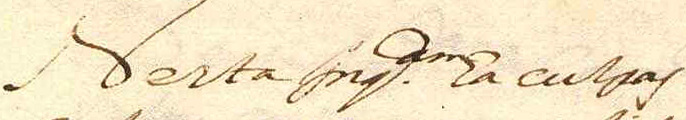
Nesta Jnq.çam ha culpas
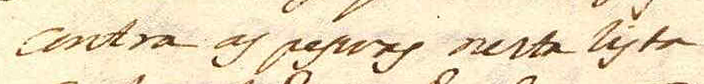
contra as pessoas nesta lista
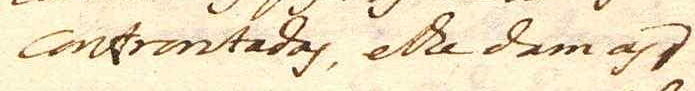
confrontadas, e lhe dam as q̄
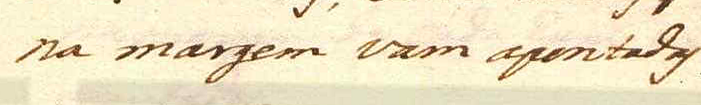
na margem vam apontadas
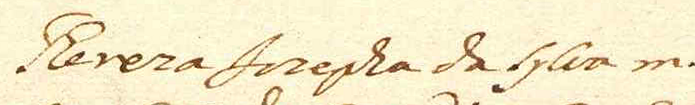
Thereza Jozepha da Sylva m.
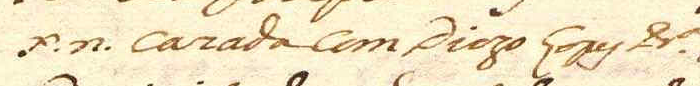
x. n. cazada com diogo Lopes Pr.a
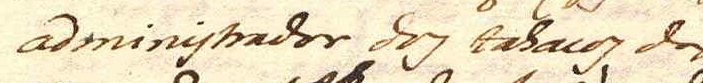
administrador dos tabacos da
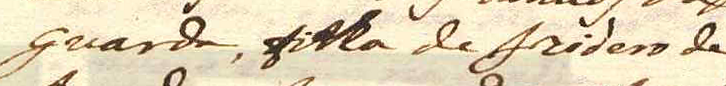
Guarda, filha de Jzidoro de
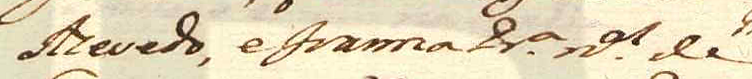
Azevedo, e Joanna Pr.a n.al de
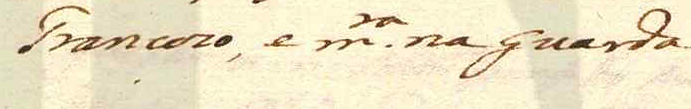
Trancozo, e m.ra na Guarda
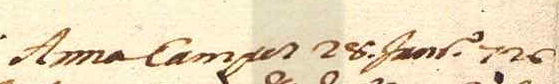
Anna Campos 28. Janr.o 726
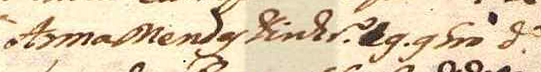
Anna Mendes Pinhr.o 9. 9bro d.o
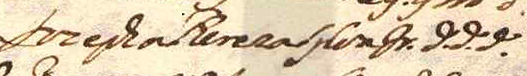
Jozepha Thereza Sylva Jr. d.o d.o d.o
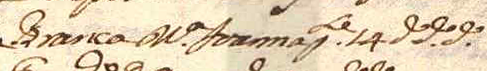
Branca M.a Joanna p.te 14 d.o d.o d.o
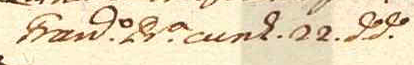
Fran.co Pr.a cunh. 22. d.o d.o
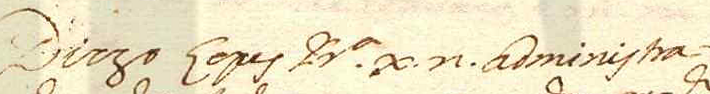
Diogo Lopes Pr.a x. n. administra
